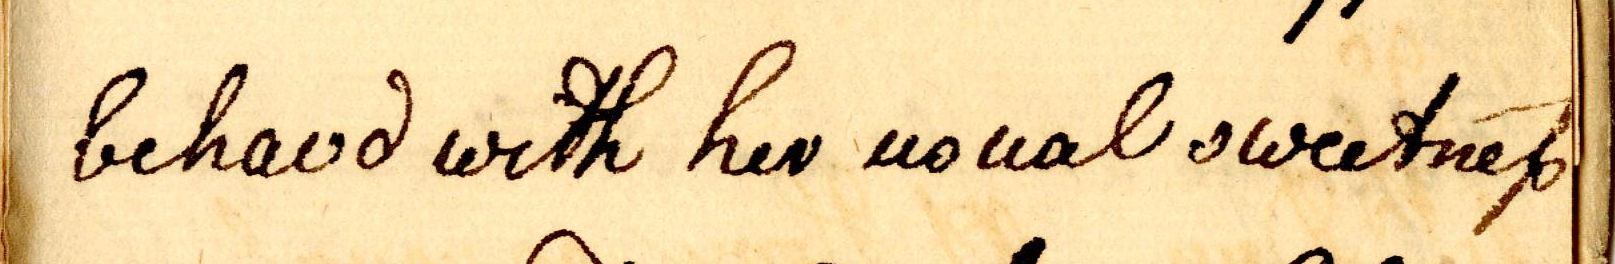behavd with her usual sweetness
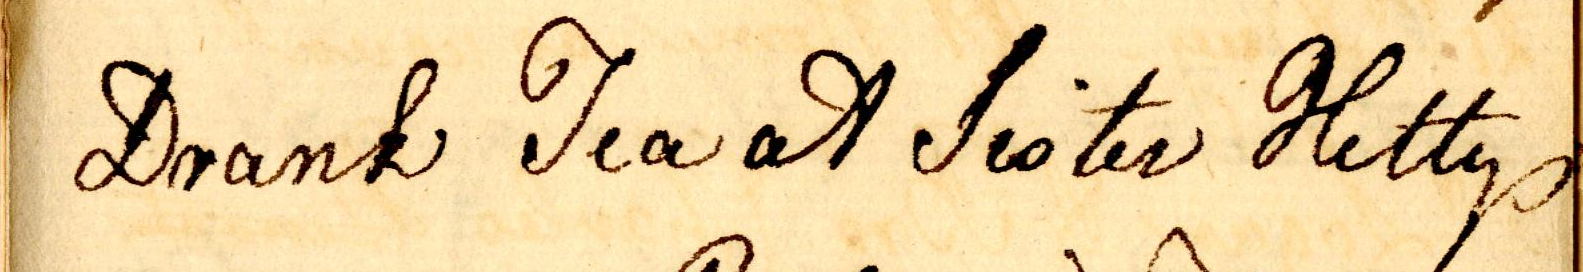Drank Tea at Sister Hettys
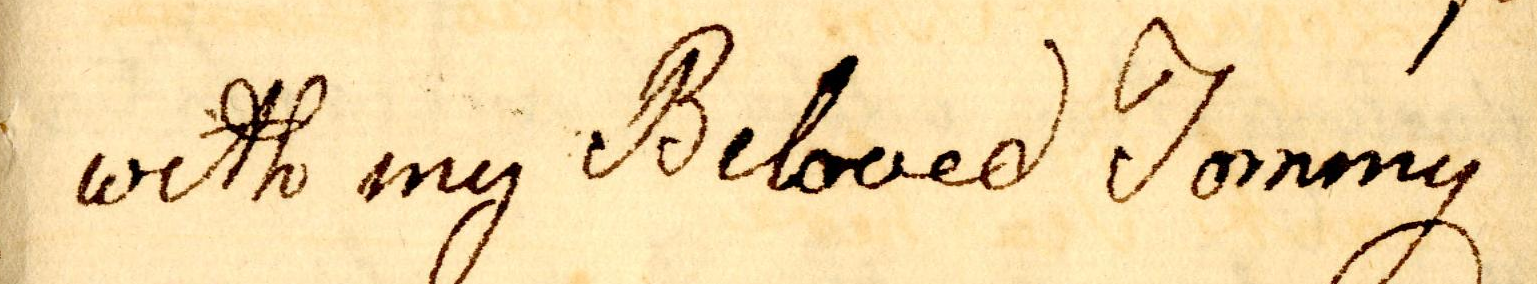with my Beloved Tommy
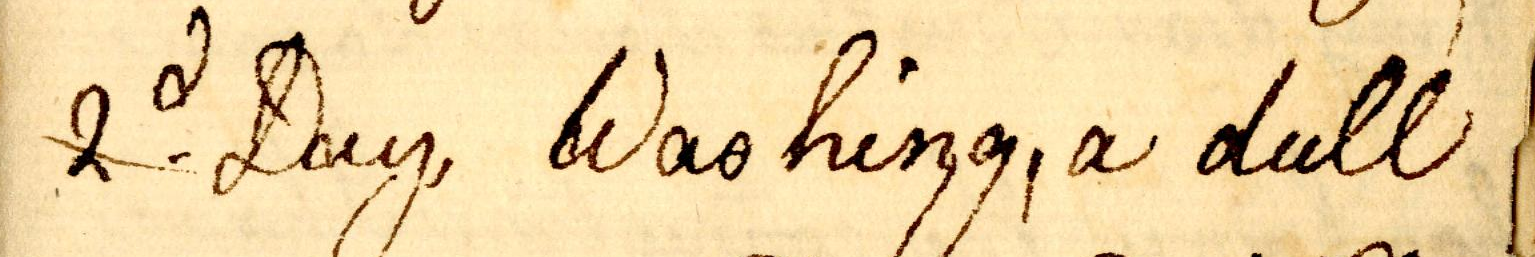2^d. Day, Washing, a dull
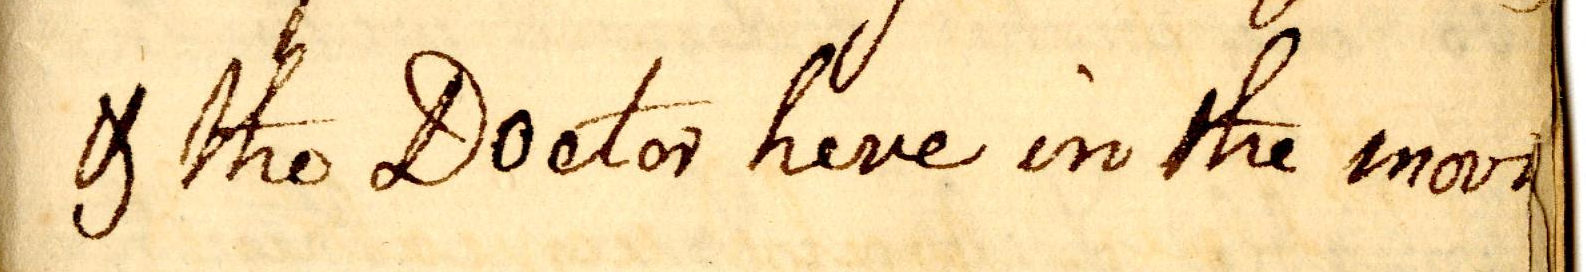& tho Doctor here in the mor[n]
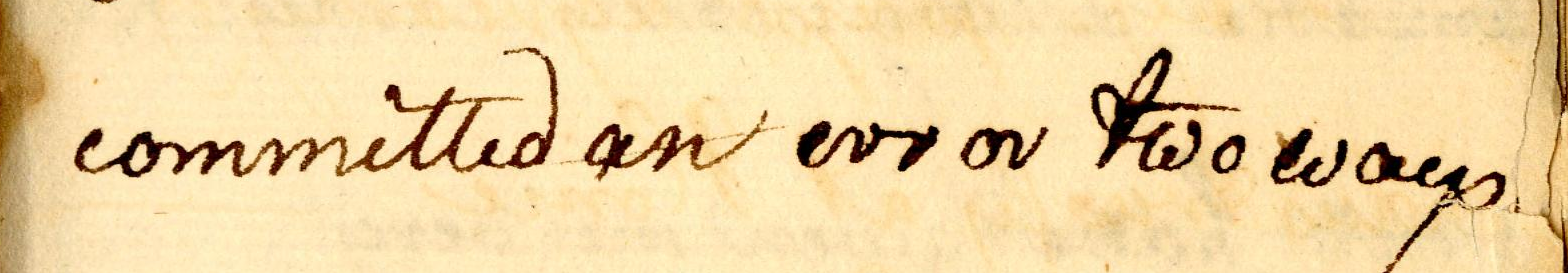committed an err or two ways
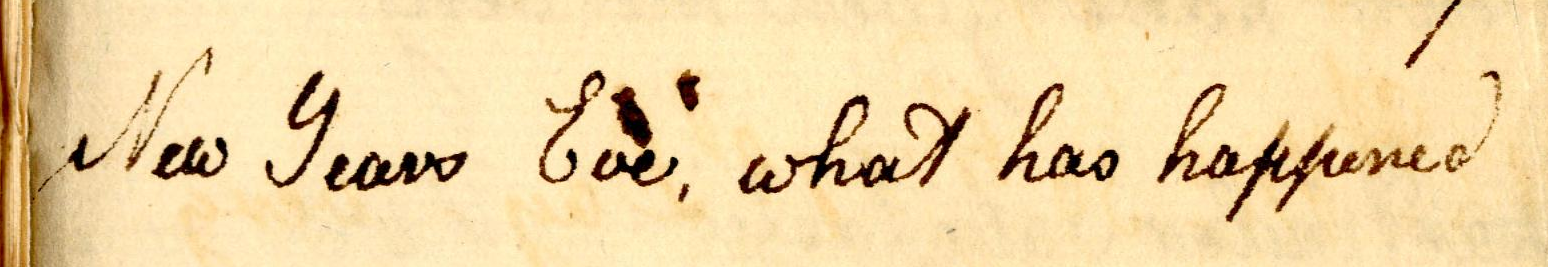New Years Eve, what has happened
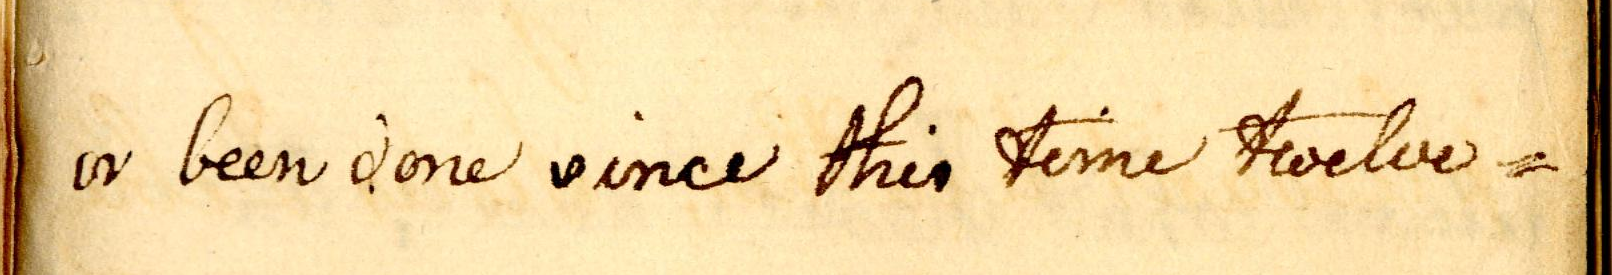or been done since this time twelve-
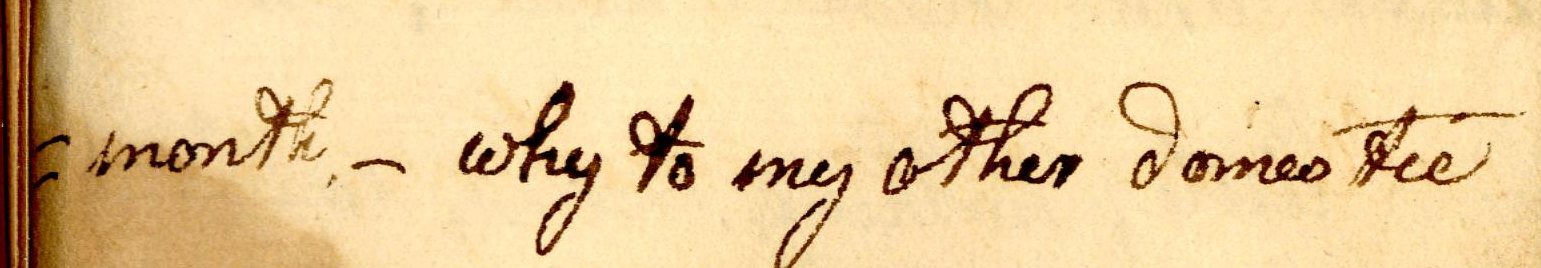-month,- why to my other domestic
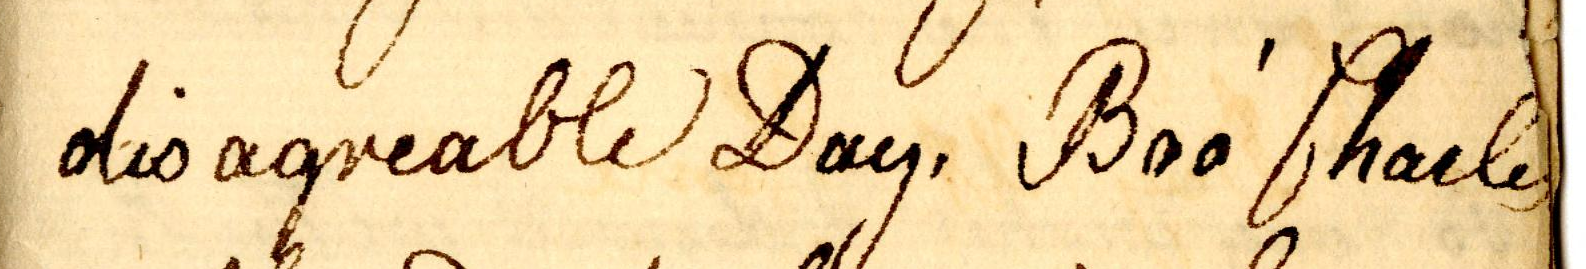disagreable Day, Bro' Charles
